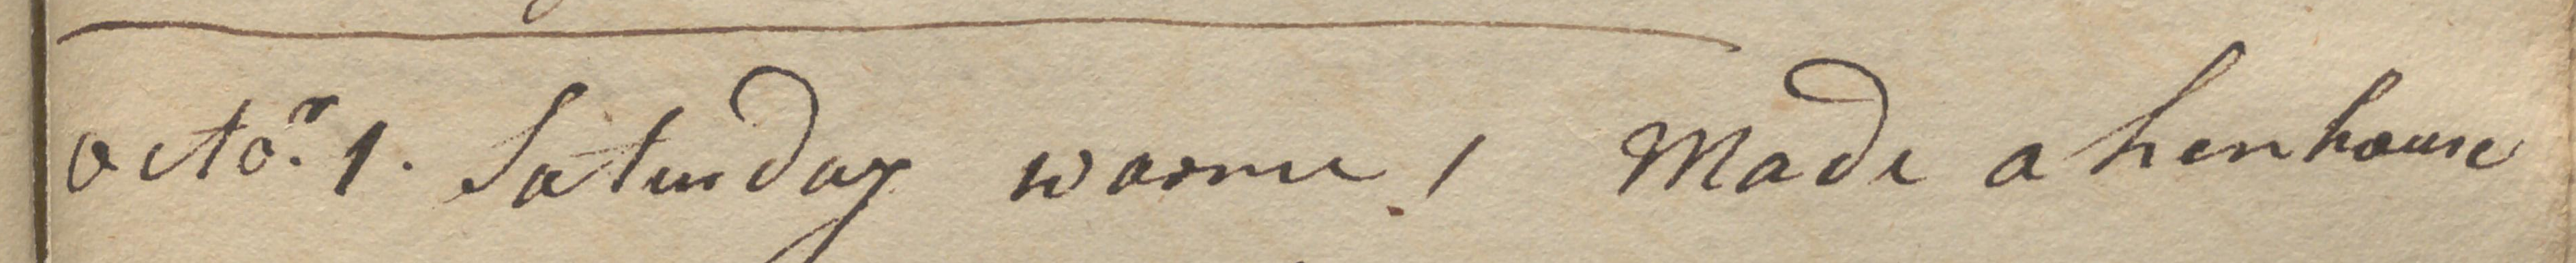Octo^r. 1^th. Saturday warme, Made a henhouse
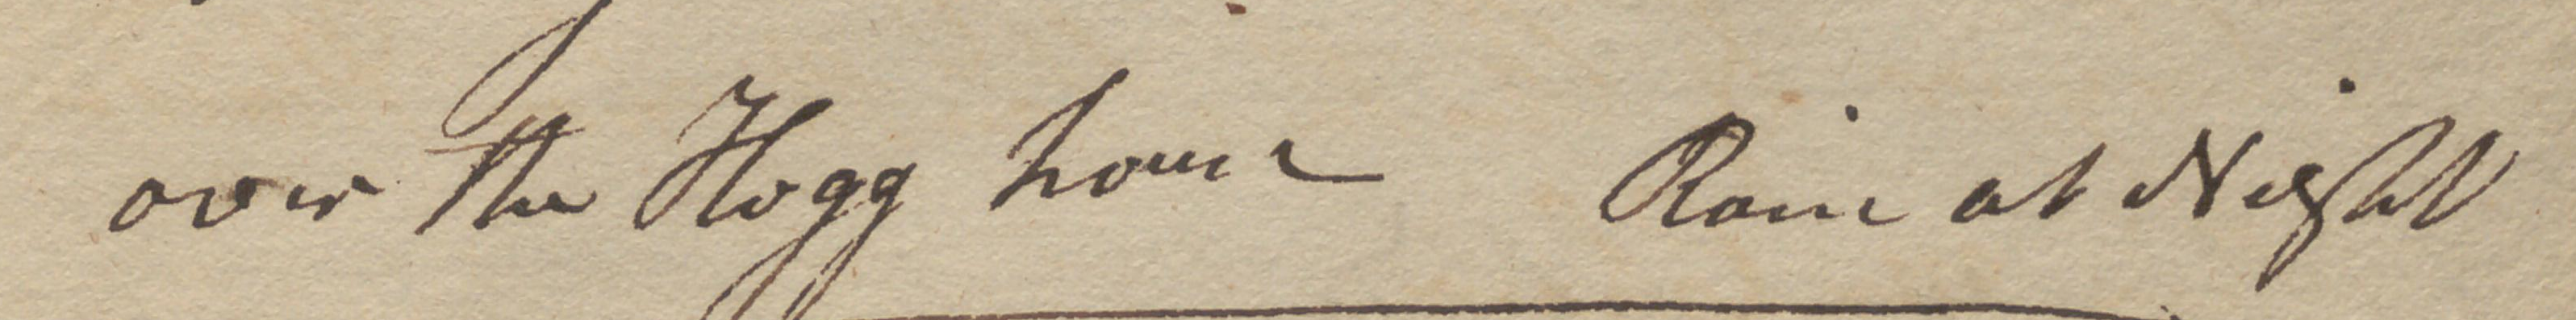over the Hogg house Rain at Night
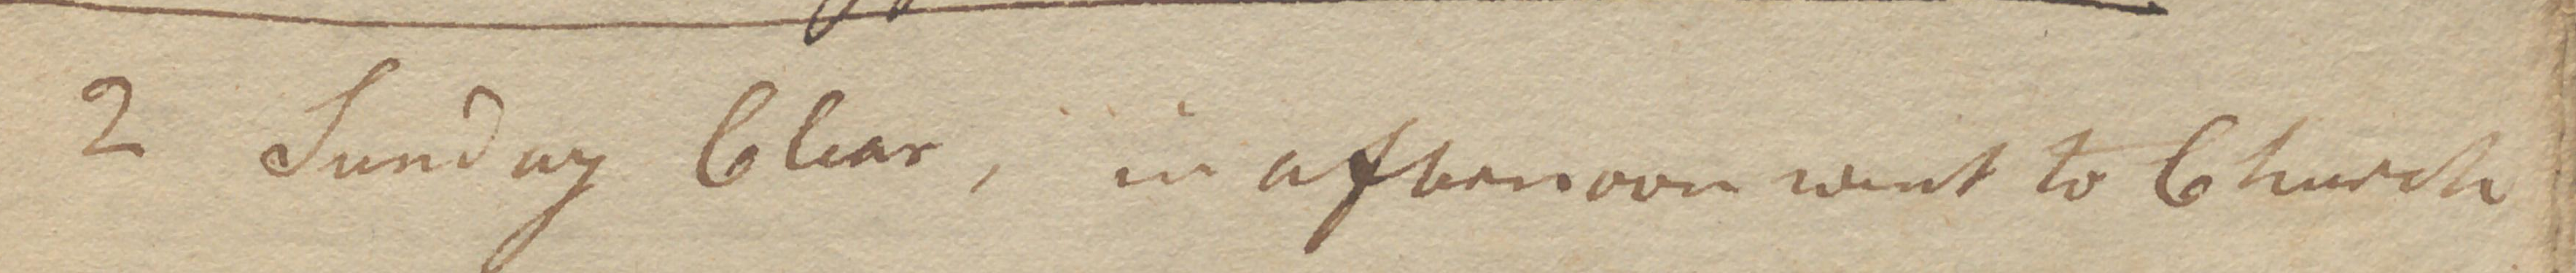2 Sunday Clear, in afternoon went to Church
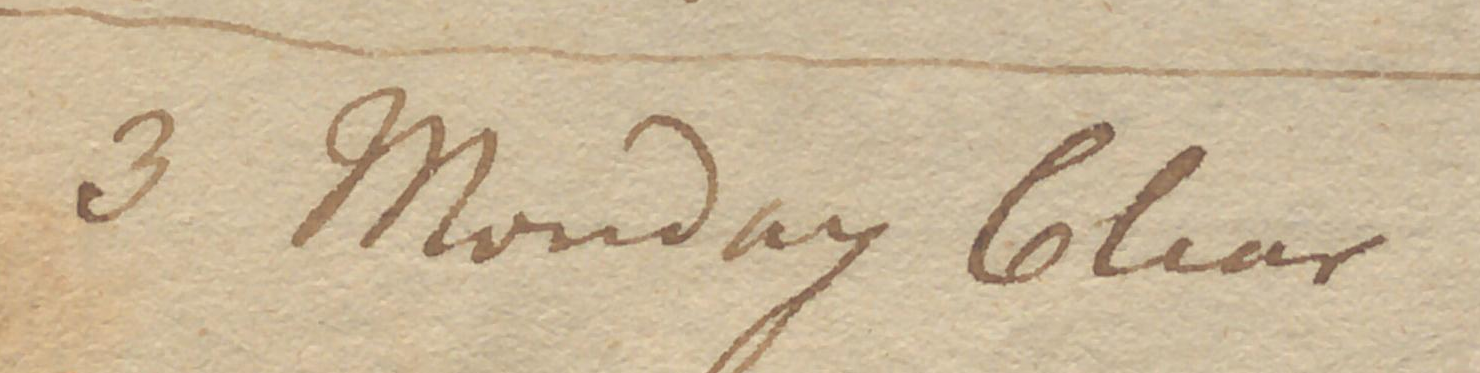3 Monday Clear
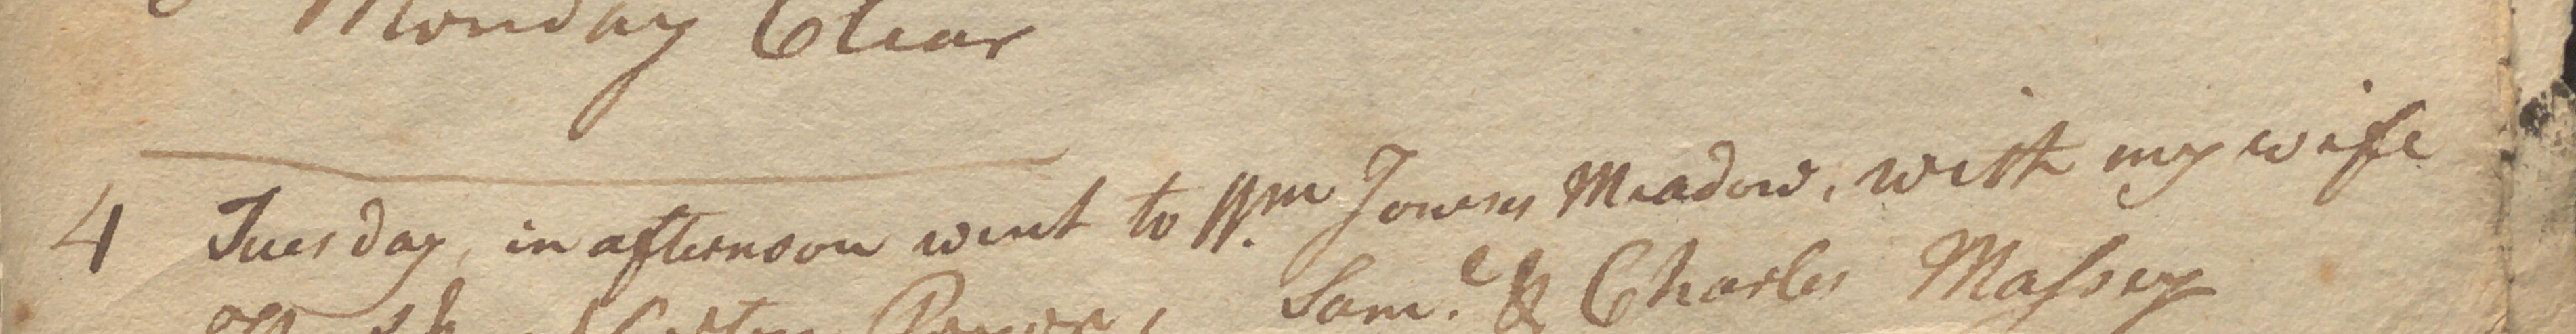4 Tuesday, in afternoon went to W^m. Joneses Meadow, with my wife
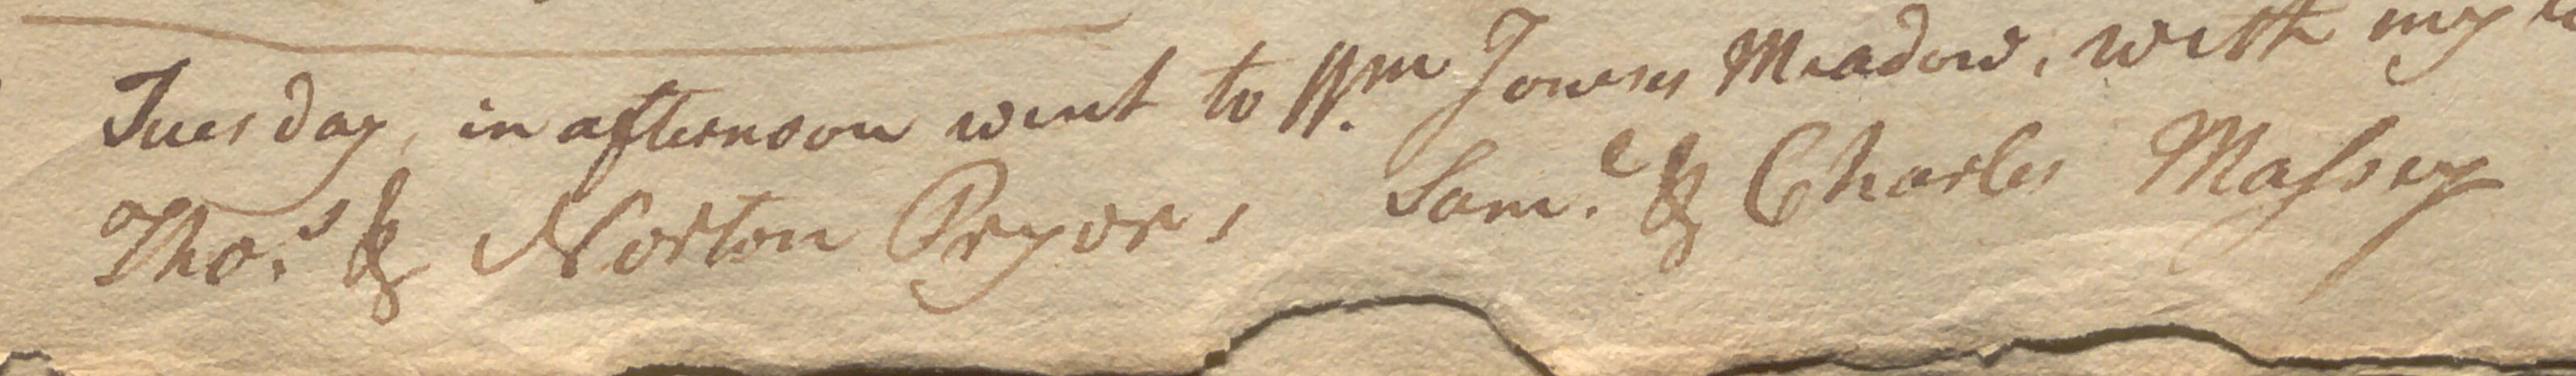Tho^s. & Norton Pryor, Sam^l. & Charles Massey
